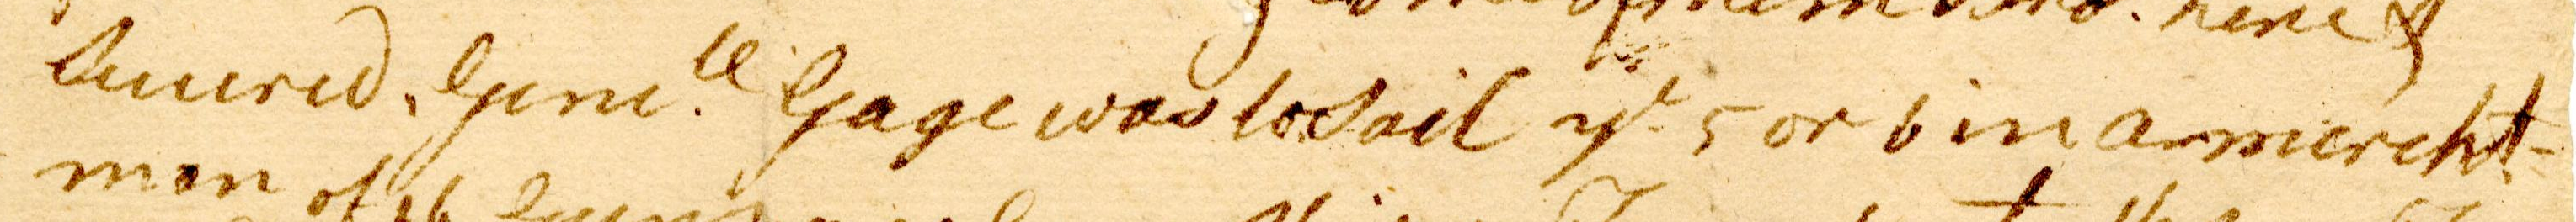severed Gen^l Gage was to sail y^e. 5 or 6 in a merch^t
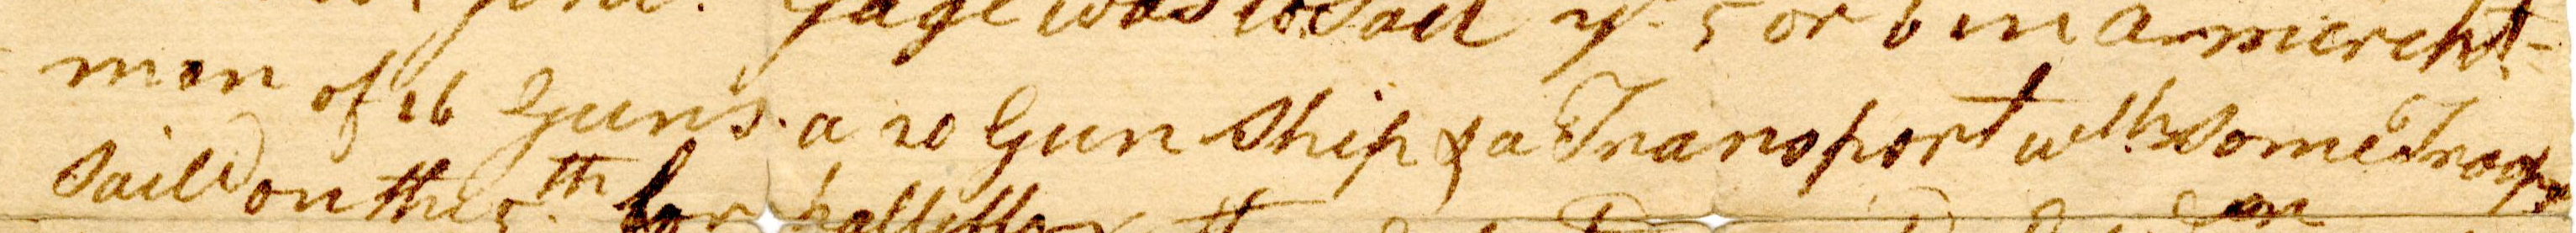men of 16 Guns a 20 Gun Ship & a Transport with some Troops
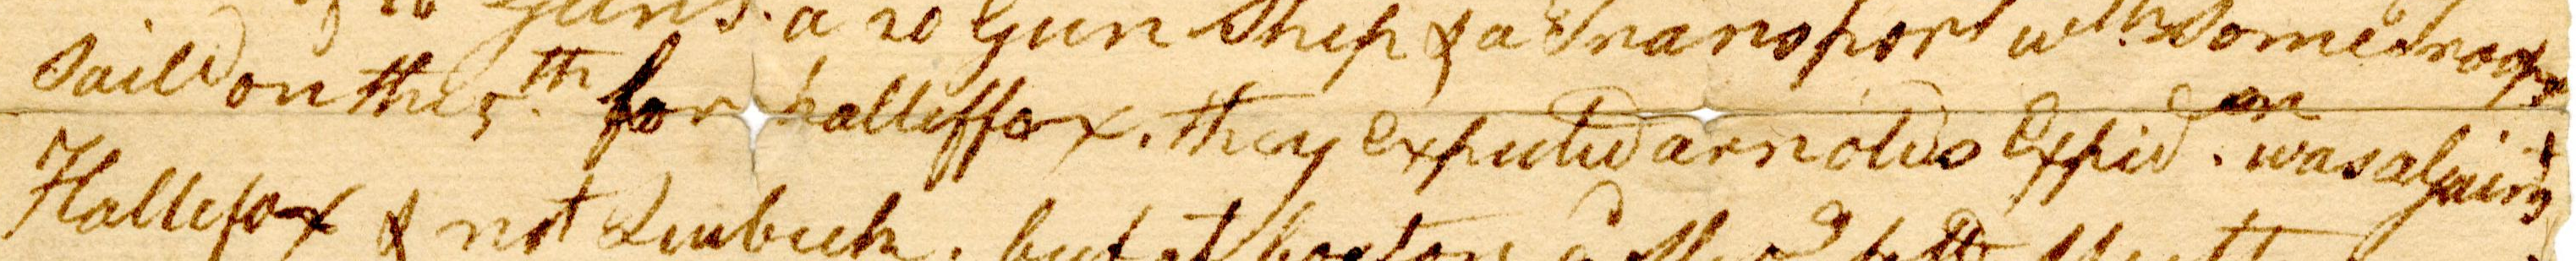saild on the 5^th. for hallifax, they expected arnolds Exped^on was against
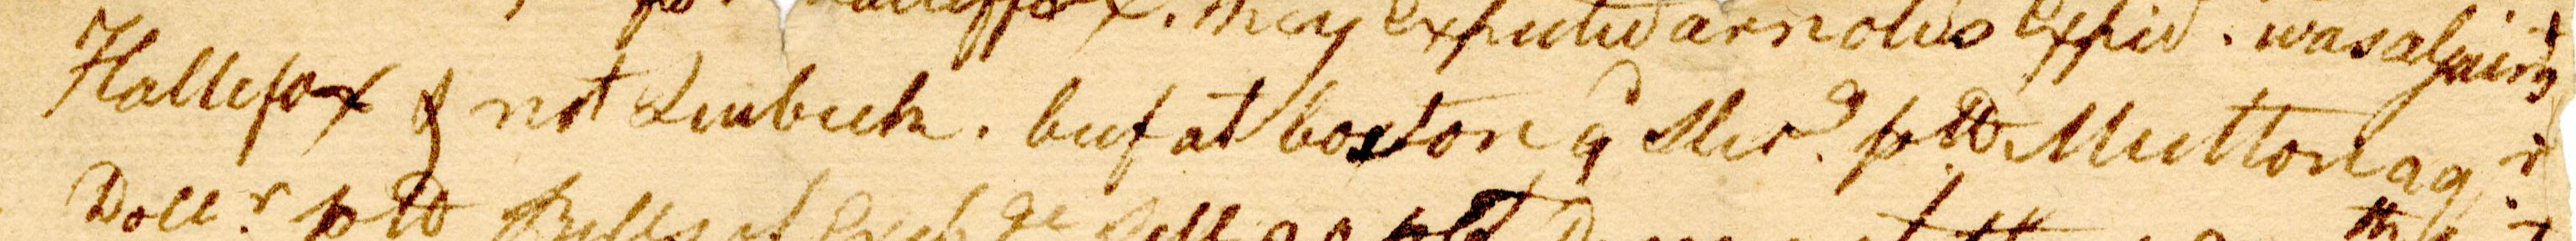Hallifax & not Leubeck. but at boston 9^d ster^g. p^d Mutton ag^t
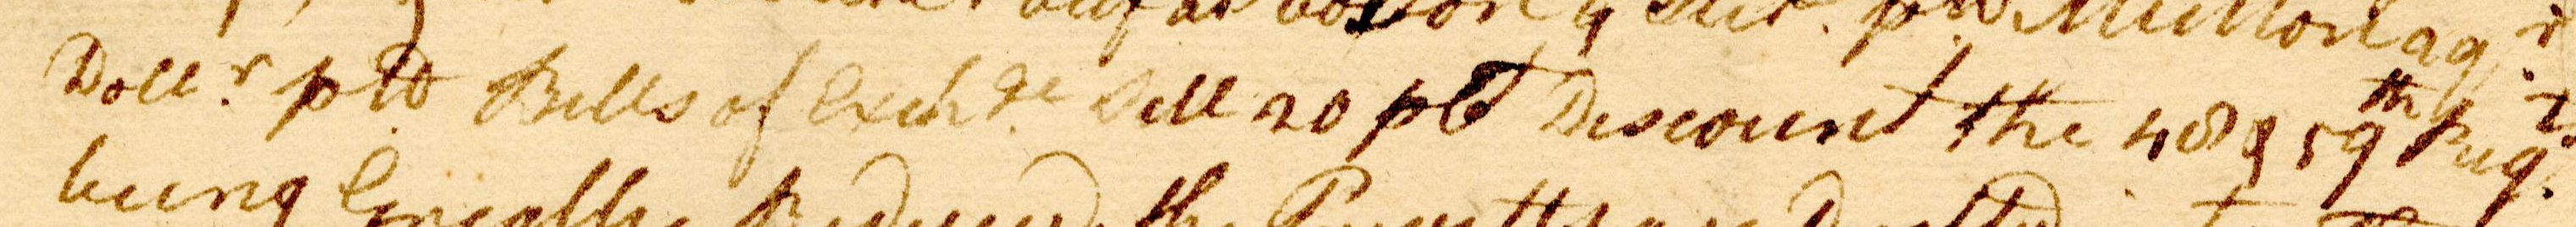Doll^r p to Bills of exch^ge sell 20 p^ct Discount the 40 & 59^th Reg^t
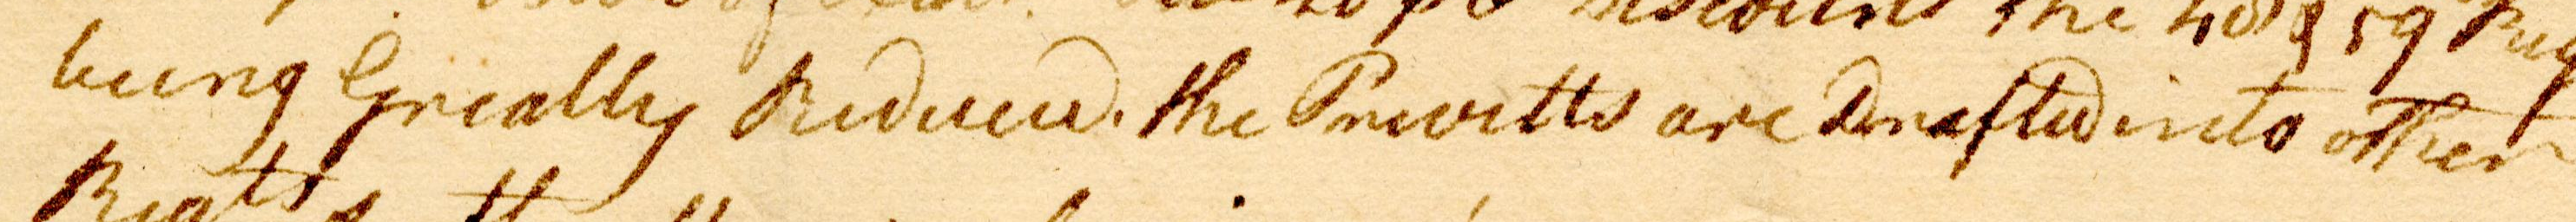being Greatly reduced the Privetts are Drafted into other
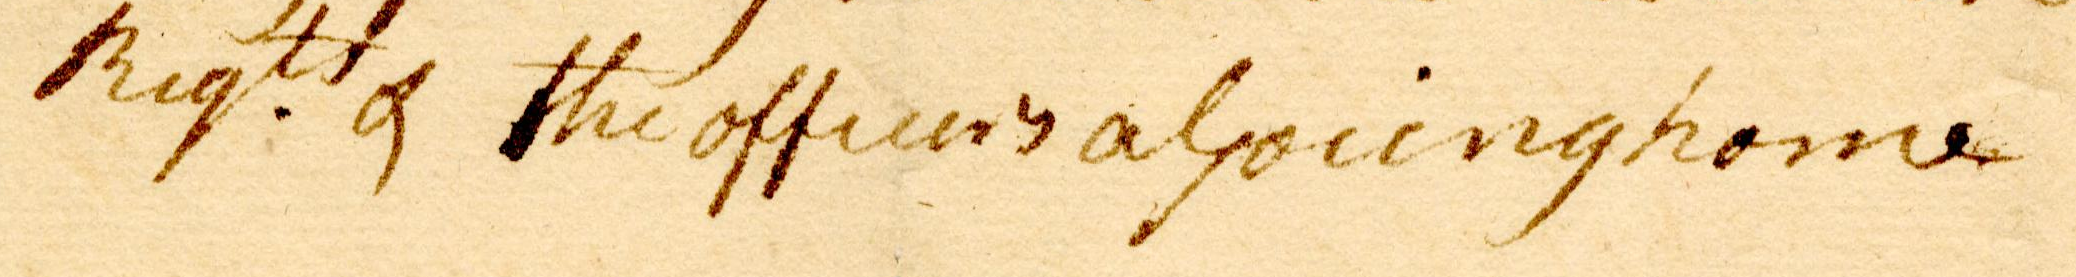Reg^ts: & the officers a Goeing home.
